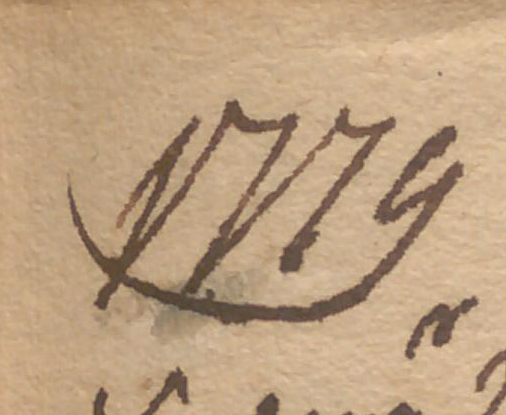1779
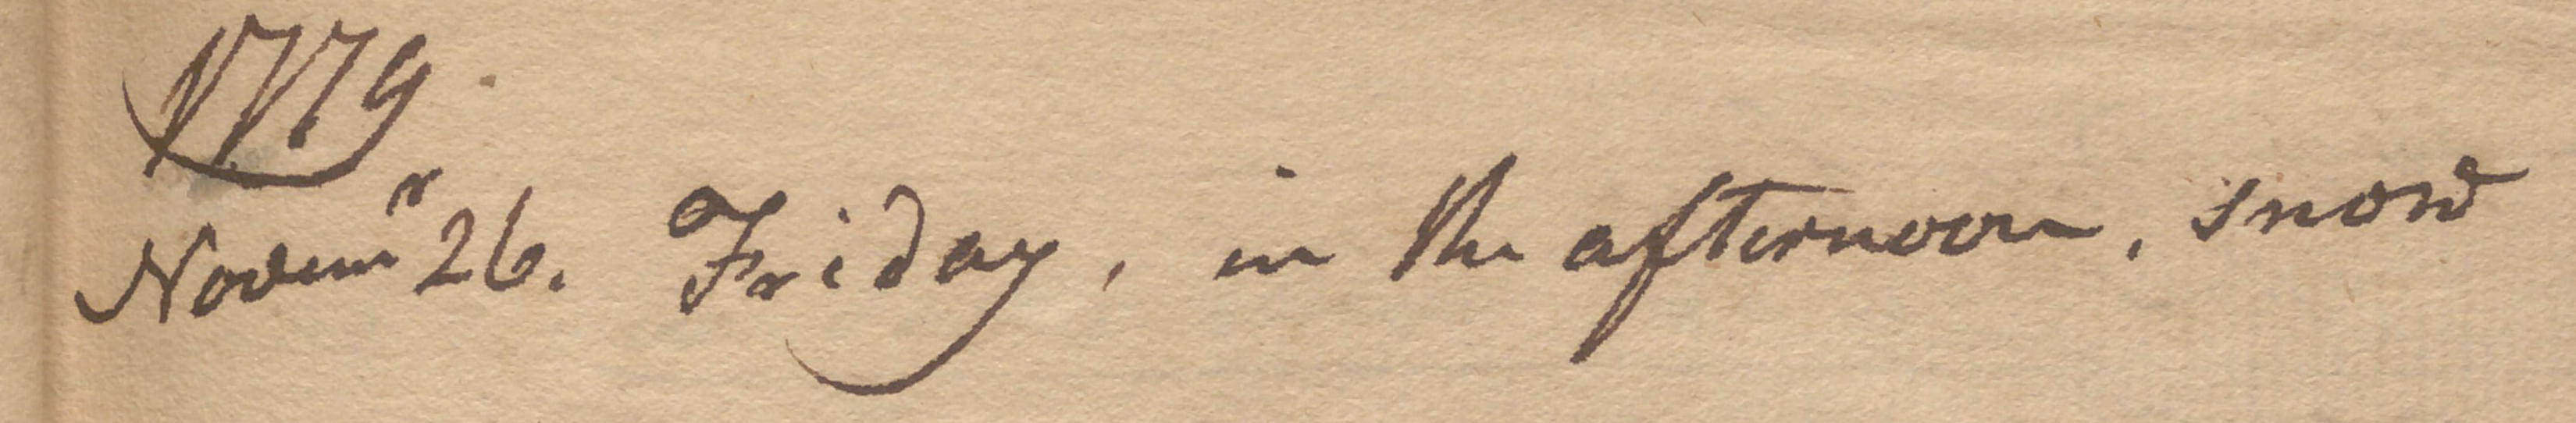Novem^r 26. Friday, in the afternoon, snow
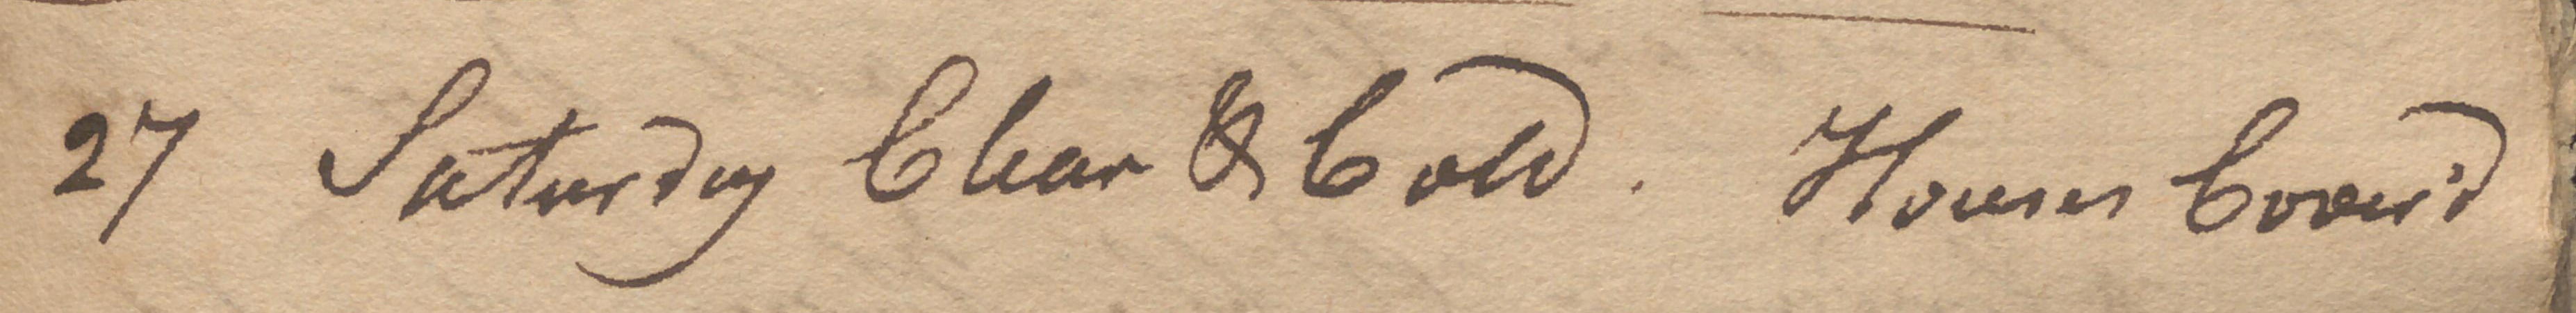27 Saturday Clear & Cold. Houses Cover'd
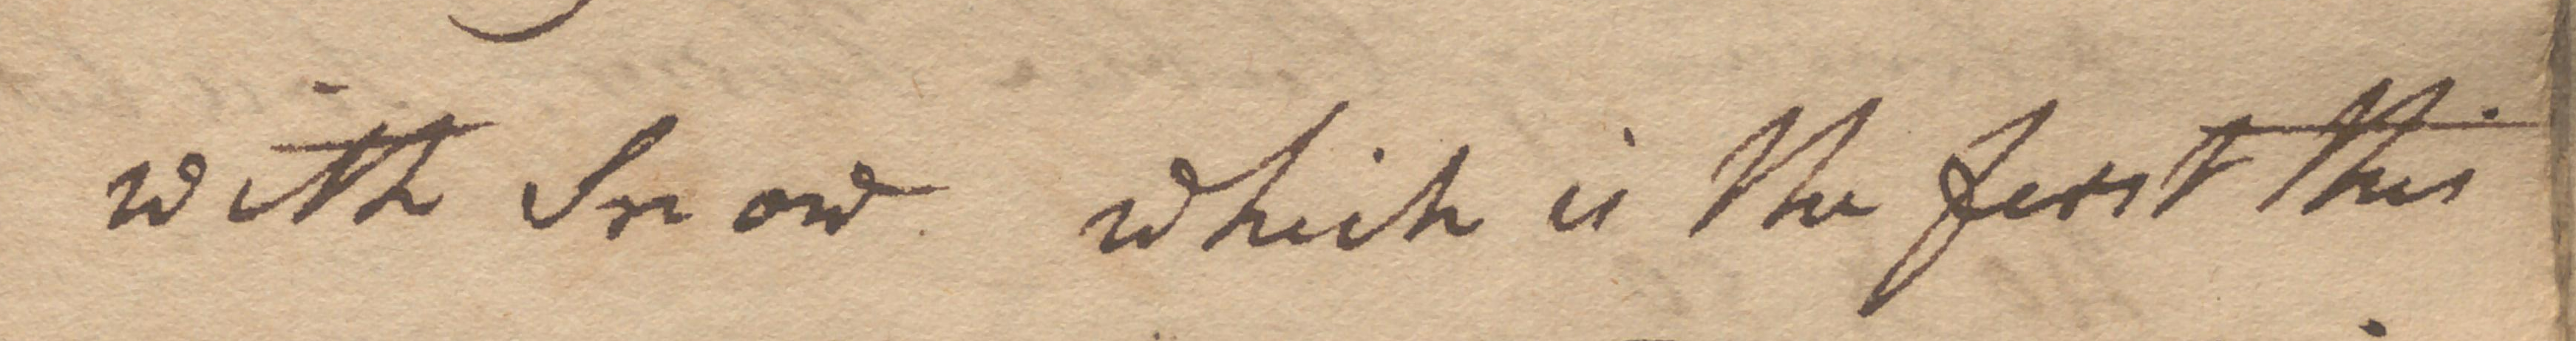with Snow which is the first this
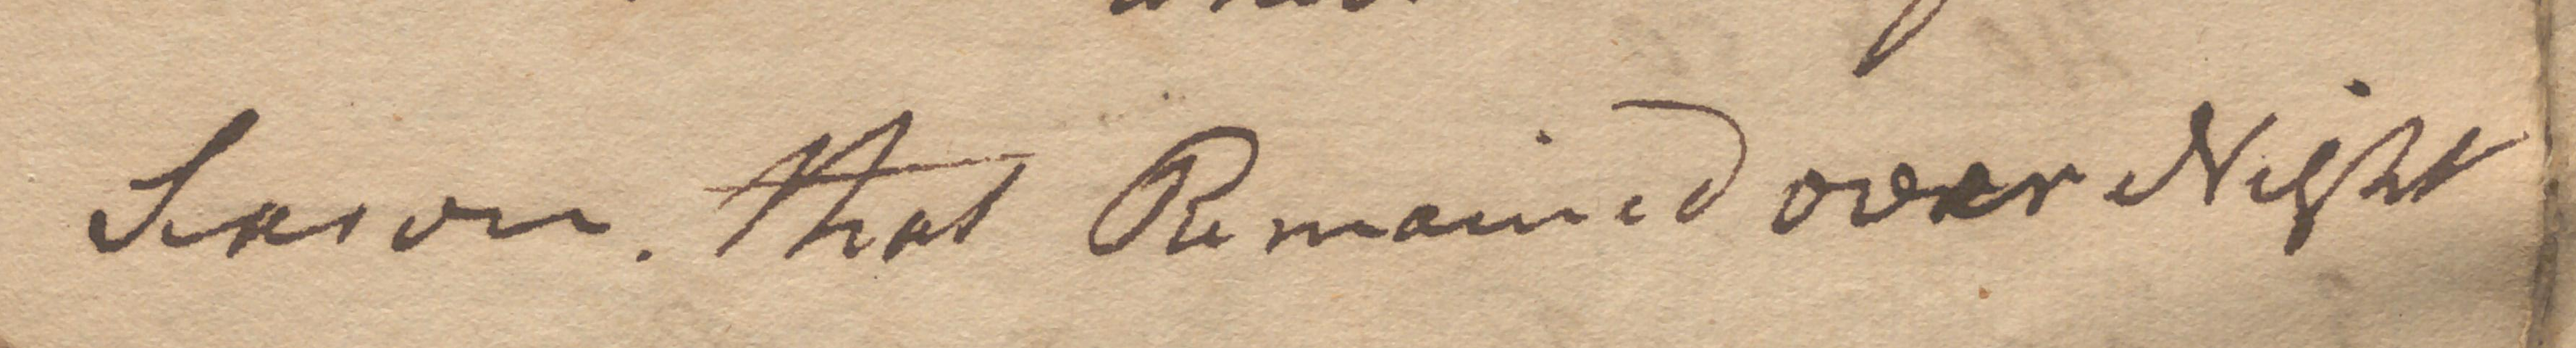Season. that Remained over Night
